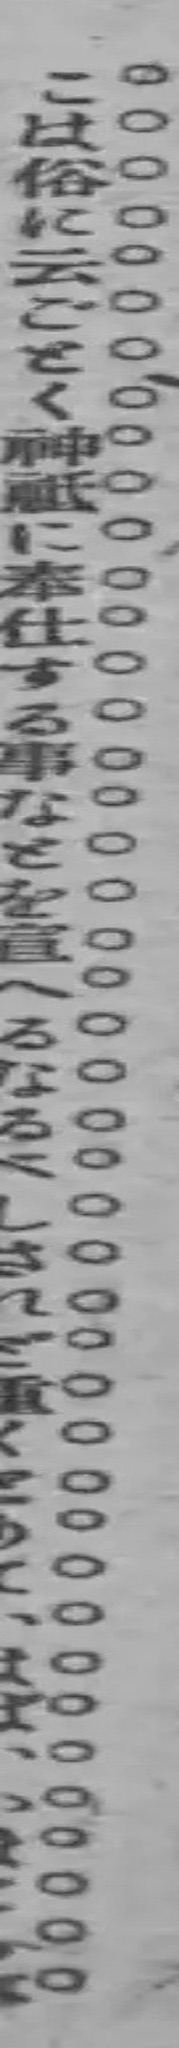こは俗に云ごとく神祇に奉仕する事なとを宣へるなるべしされど重くとりてはいはばいかほとも大
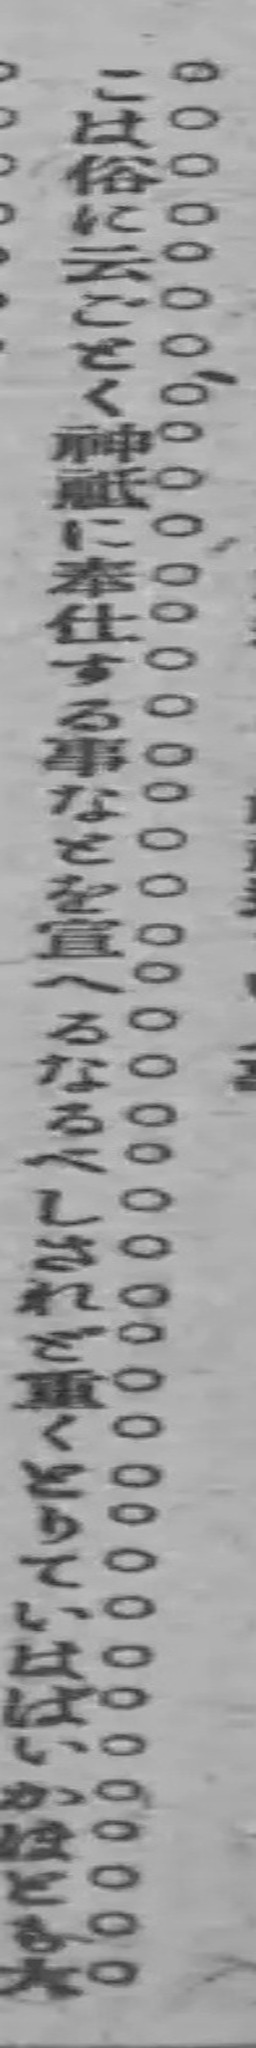こは俗に云ごとく神祇に奉仕する事なとを宣へるなるべしされど重くとりてはいはばいかほとも大
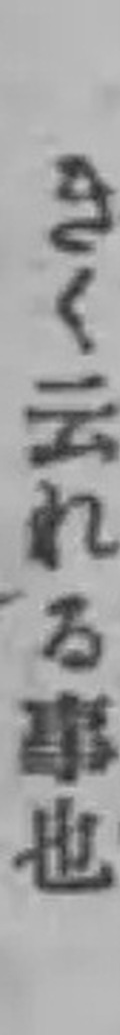きく云れる事也
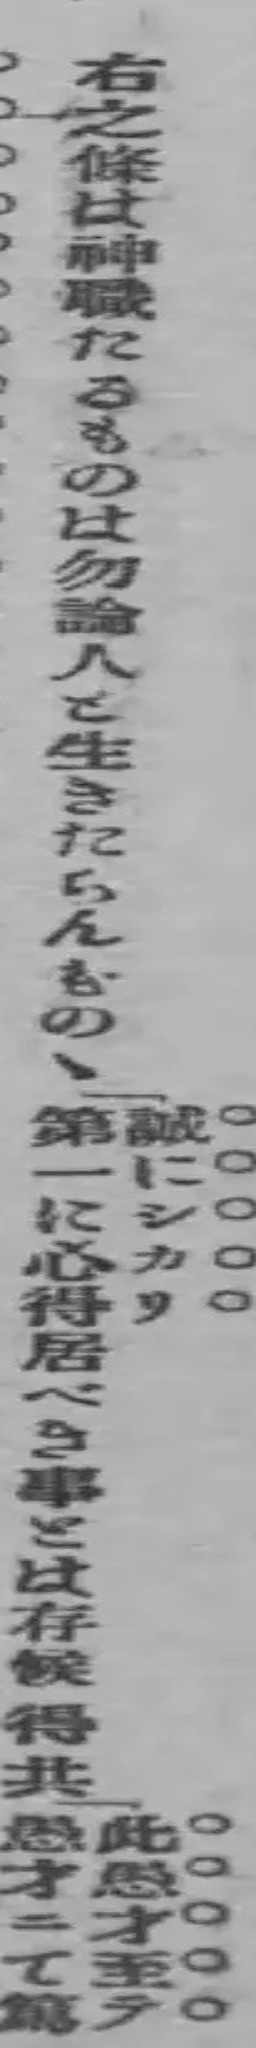右之條は神職たるものは勿論人と生きたらんものゝ第一に心得居べき事とは存候得共愚才にて篤
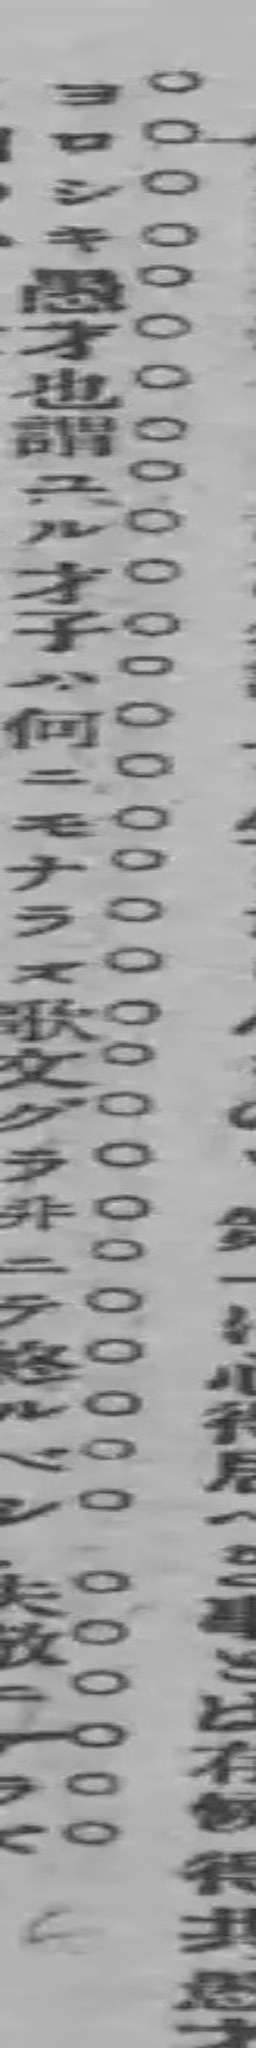ヨロシキ愚才也謂ユル才子ハ何ニモナラズ歌文グラヰニテ終ルベシ失敬ニアラズ
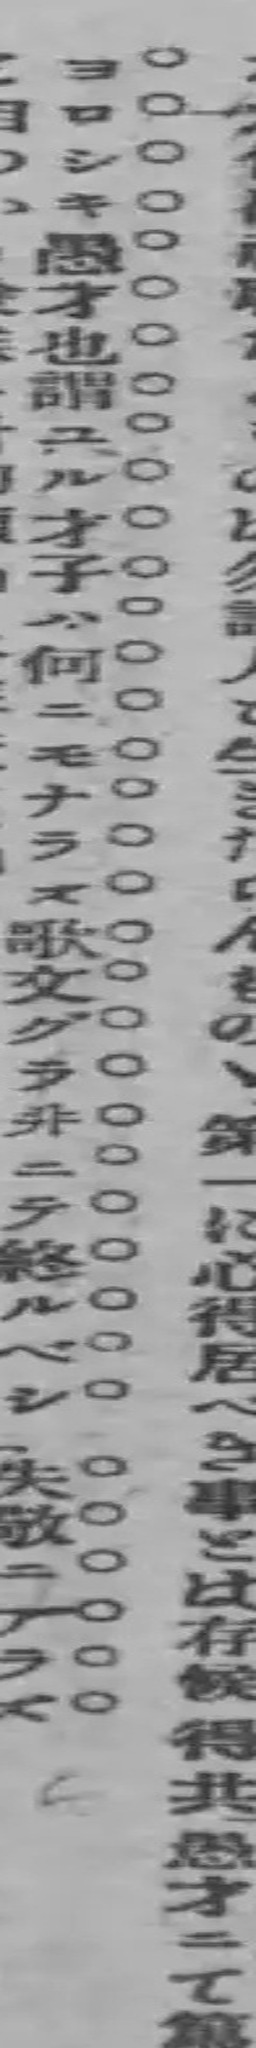ヨロシキ愚才也謂ユル才子ハ何ニモナラズ歌文グラヰニテ終ルベシ失敬ニアラズ
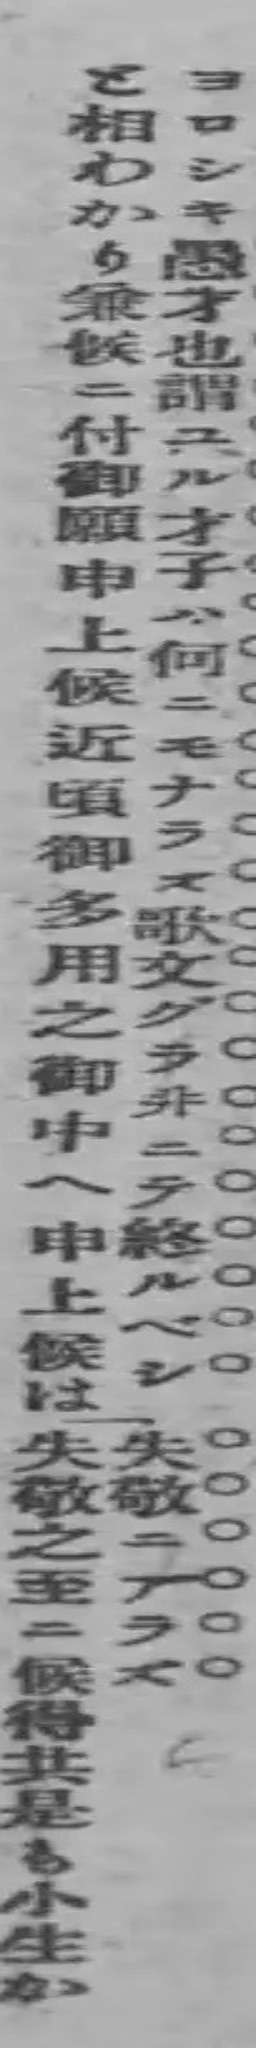と相わかり兼候ニ付御願申上候近頃御多用之御中ヘ申上候は失敬之至ニ候得共是も小生か
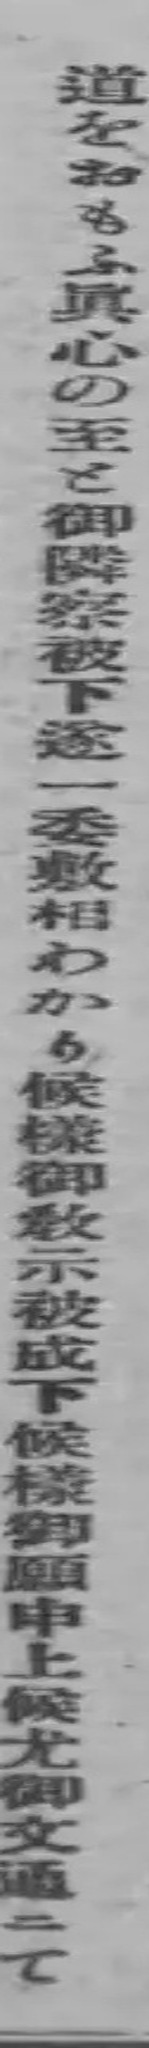道をおもふ真心の至と御隣察被下遂一委敷相わかり候様御教示被成下候様御願申上候尤御文通にて
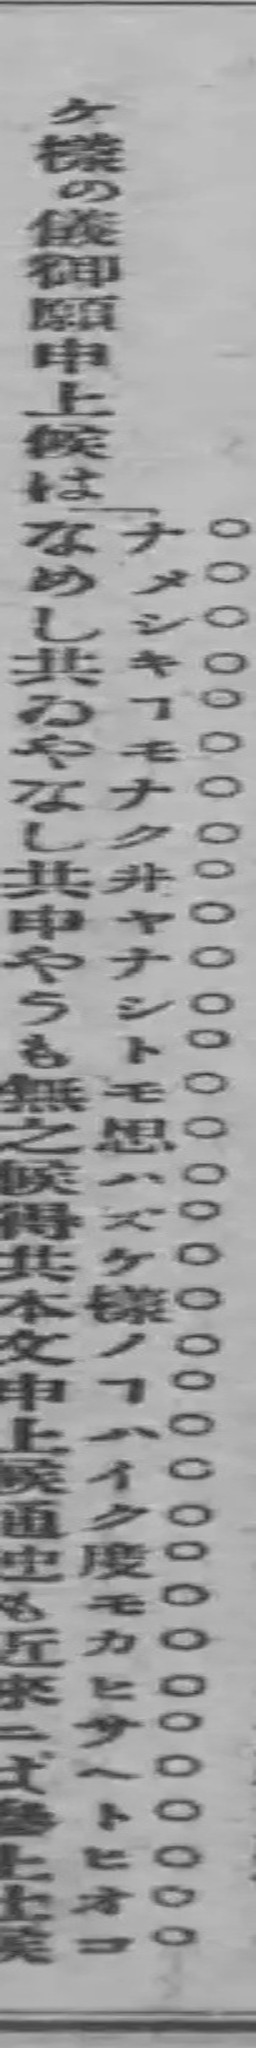ケ様の儀御願申上候はなめし共ゐやなし共申やうも無之候得共本文申上候通迚も近来には参上仕候
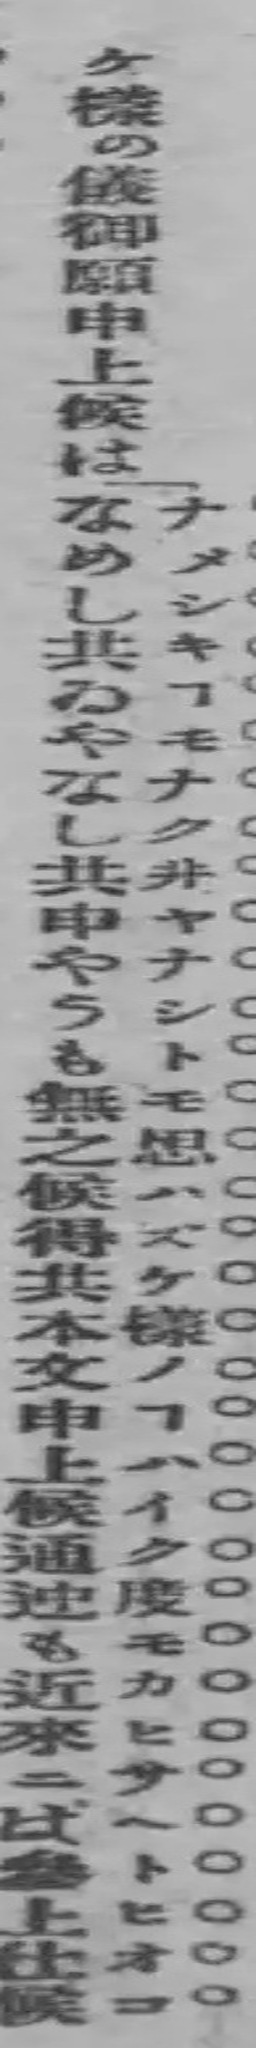ケ様の儀御願申上候はなめし共ゐやなし共申やうも無之候得共本文申上候通迚も近来には参上仕候
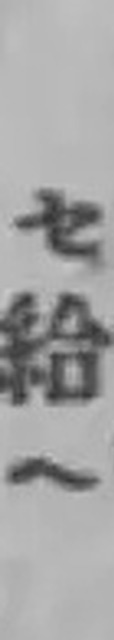セ給ヘ
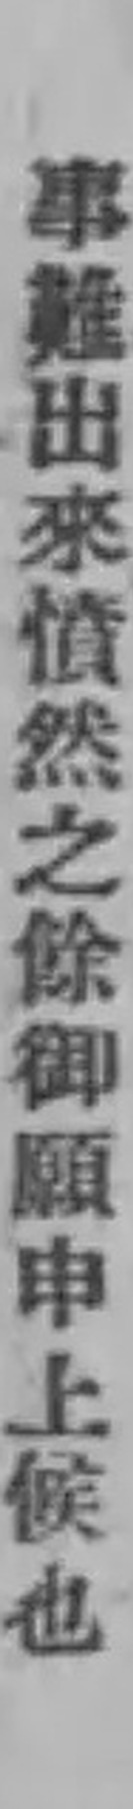事難出来憤然之余御願申上候也
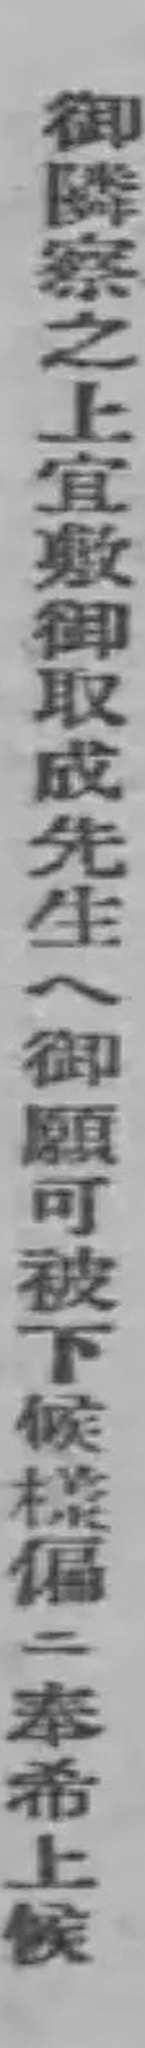御隣察之上宜敷御取成先生へ御願可被下候様偏ニ奉希上候
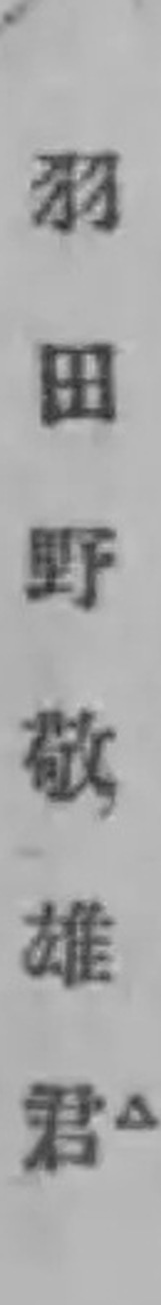羽田野敬雄君
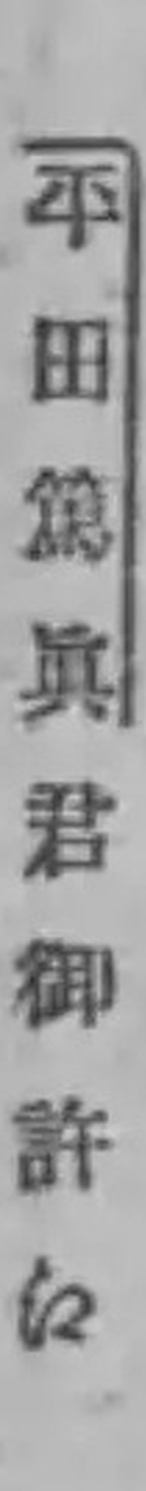平田篤実君御許え
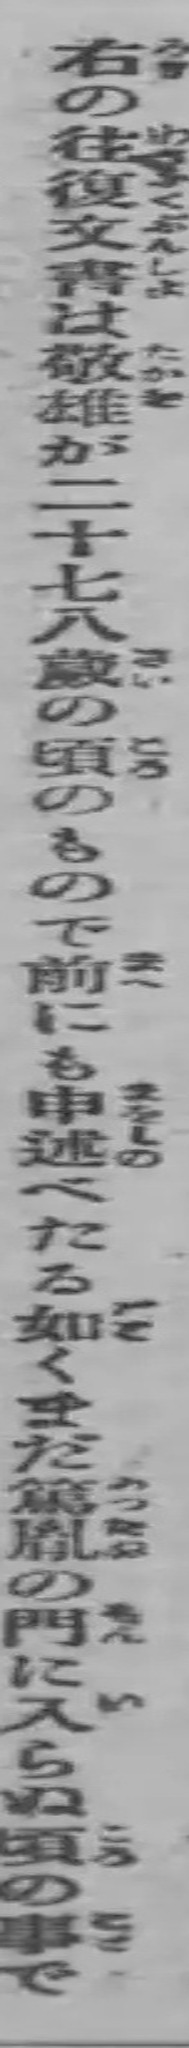右の往復文書は敬雄が二十七八歳の頃のもので前にも申述べたる如くまだ篤胤の門に入らぬ頃の事で
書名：豊橋市史談
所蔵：国立国会図書館 National Diet Library, JAPAN
